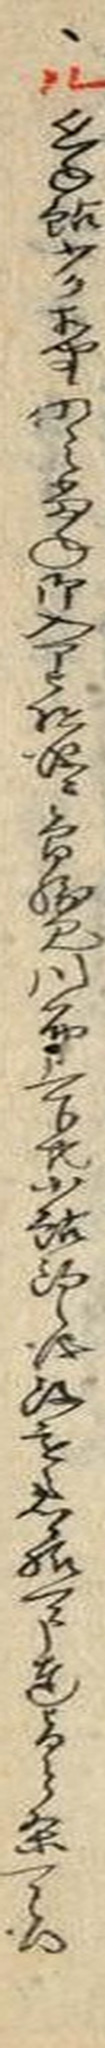・近年鮎少ク相聞仍之当年御入部被遊儀ニ候間勝見川筋上下共小鮎釣之儀致遠慮候様可申達旨之条可被得

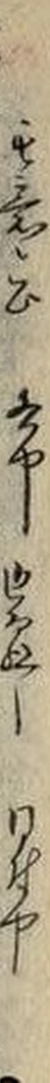其意候以上各中追而組へ目付中
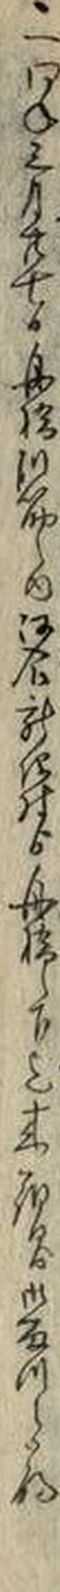・同年三月廿七日舟橋川筋之内河合新保村ゟ舟橋之下迄来朔日ゟ御留川之御触
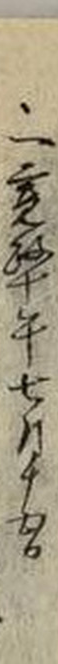・寛政十午七月十五日
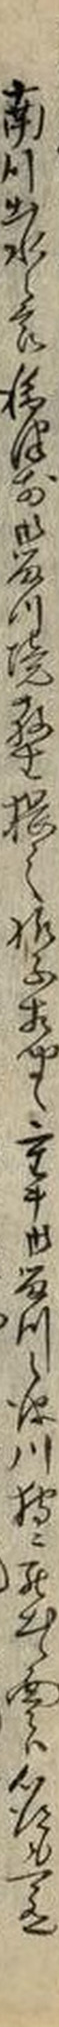南川出水之節稲津前御留川境殺生猥之様子相聞候重キ御留川之儀川狩ニ罷出候面々ハ心得も可有
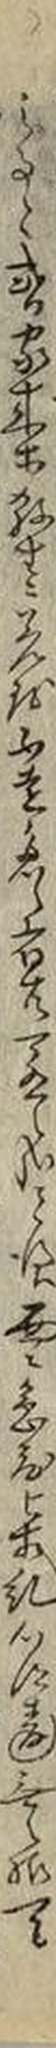之事ニ候或ハ家来等殺生ニ差越不遠慮之者共可有之哉ニ候得ハ面々急度被相糺心得違無之様可被
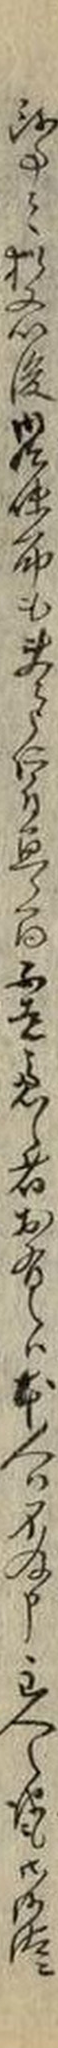致事ニ候猶又以後御吟味筋も夫々被仰付置候間不遠慮之者於有之ハ本人ハ不及申主人之儀も御沙汰ニ
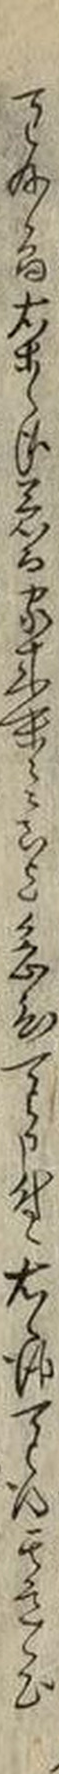可被及候間右等之趣兼而家来末々ニ至迄急度可被申付候右之趣可被得其意候已上
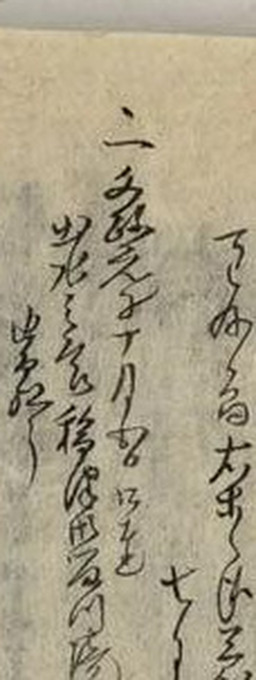・文政元寅十月五日口達
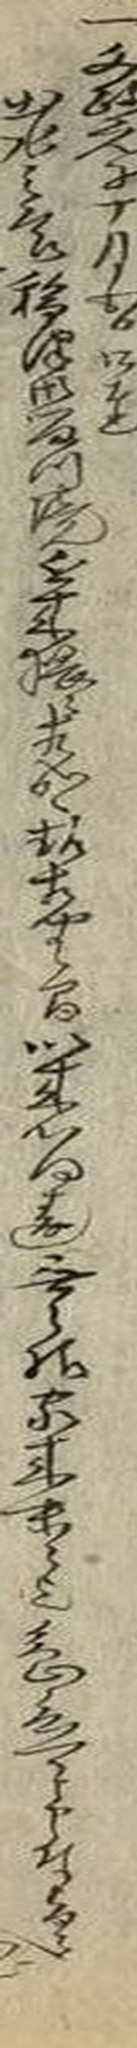出水之節稲津御留川境近来猥ニ相成候趣相聞候間以来心得違無之様家来末々迄急度可被申付旨ニ候以上
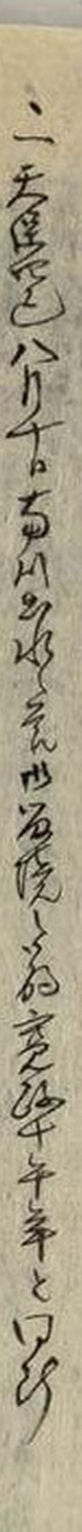・天保四巳八月十日南川出水之節御留境之御触寛政十午年と同断
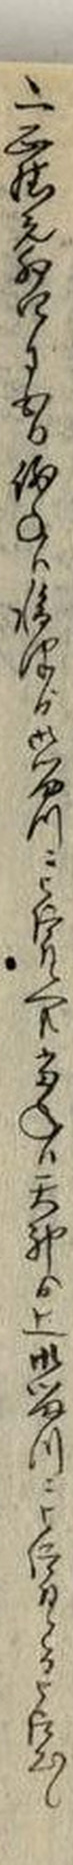・一正徳元卯四月五日例年ハ稲津ゟ御留川ニ被仰付候へ共当年ハ天神ゟ上御留川ニ被仰付候旨被仰出候
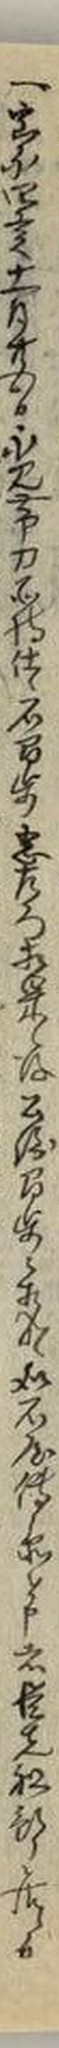一宝永四亥十一月廿五日永見帯刀所持仕候石間歩忠左衛門相果候後公儀間歩ニ相成候処石屋伝兵衛と申者従先祖預り居候ニ付
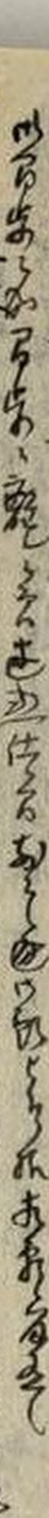御間歩ニ成間歩ニ離レ候而ハ迷惑仕候間前々之通御預被下候様相願候留有之
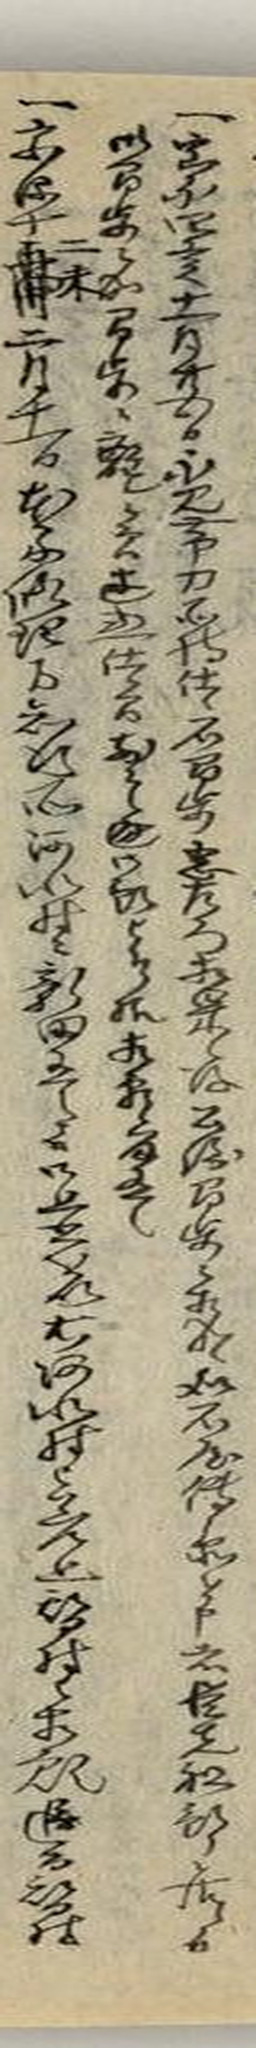一享保十二未二月十一日本多修理方知行所河水村ニ新田有之ニ付口上書を以右河水村被差上替村被相願追而替村
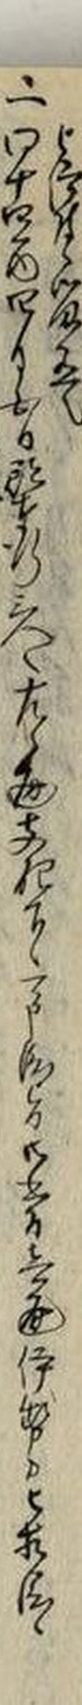・一同十四酉四月五日郡奉行三人へ左之通支配下へ可申渡旨御書付壱通伊勢方被相渡候
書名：御国他国諸事之部
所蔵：福井県文書館 Fukui Prefectural Archives
